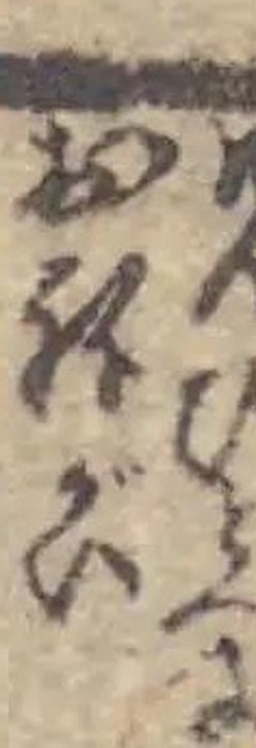おねがい
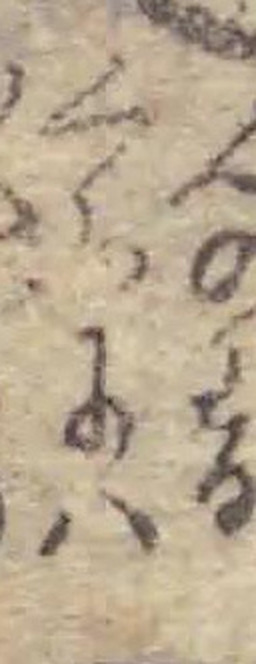くちには
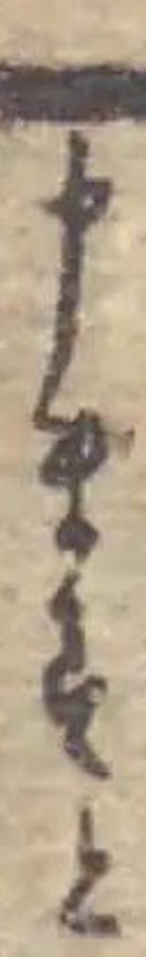申ますと
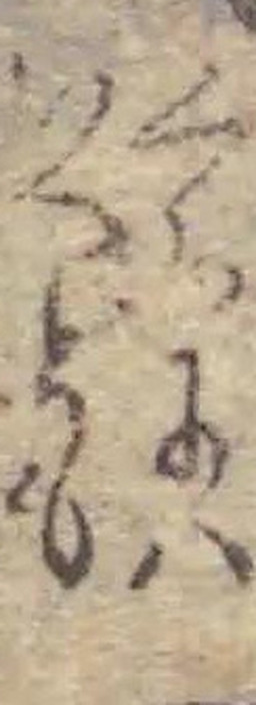いへども
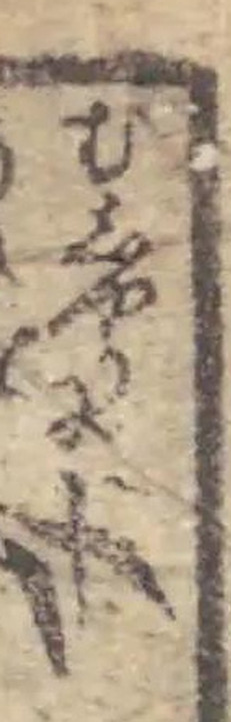むしやうに
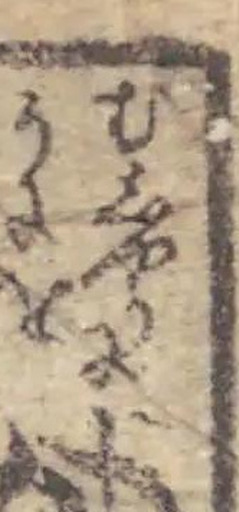むしやうに
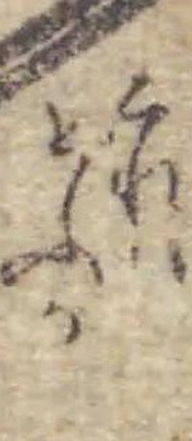どふか
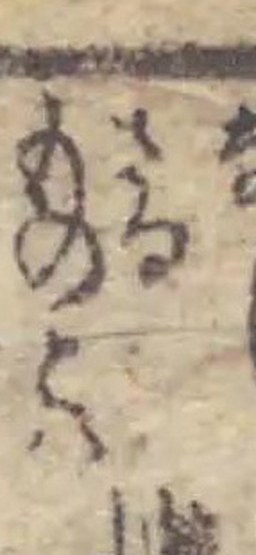ものとは
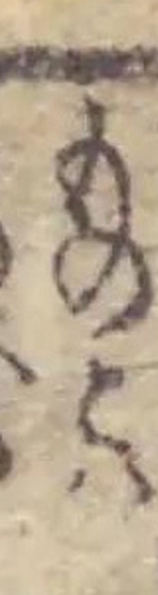ものとは
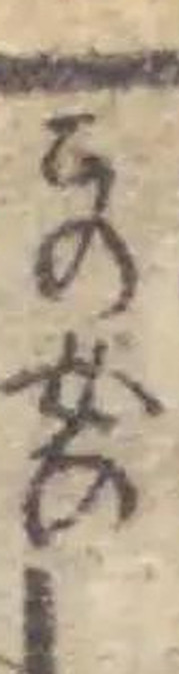この女の
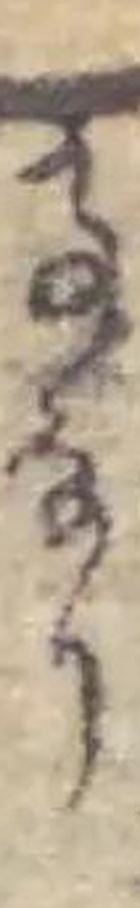事なり
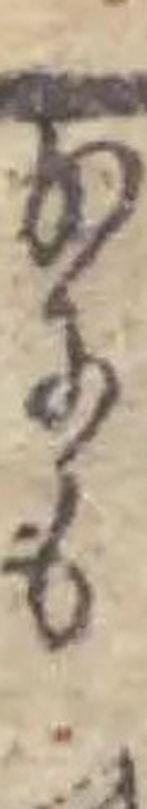かにも
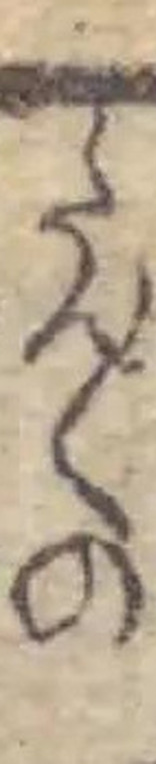たん〳〵の
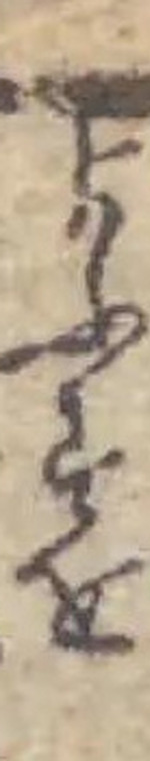よふすを
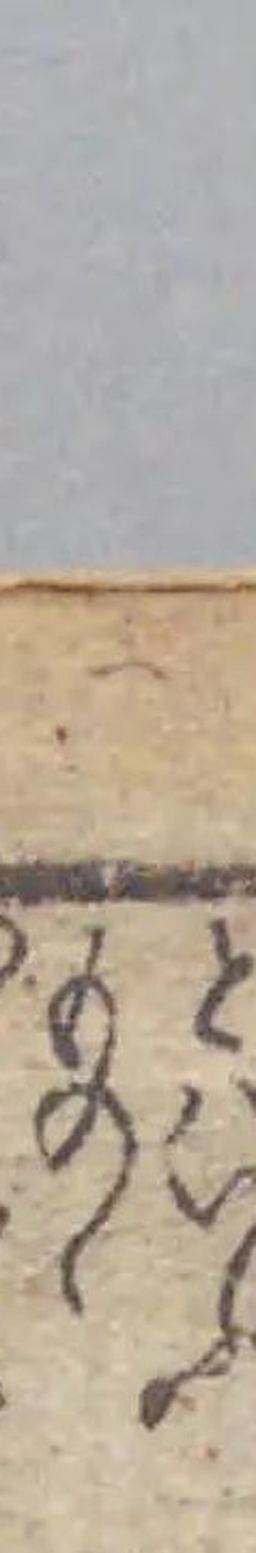ものゝ
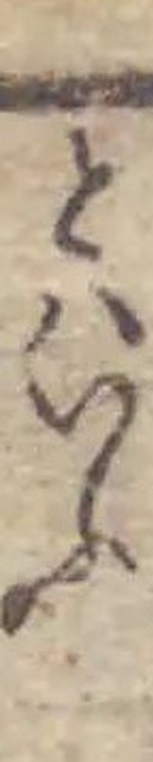とはいふ
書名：蟹牛房挟多 3巻
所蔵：国立国会図書館 National Diet Library, JAPAN
